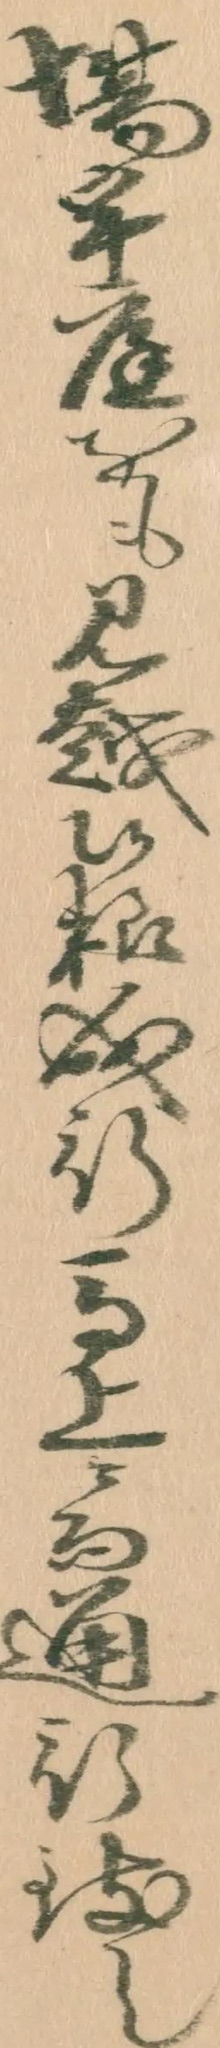場牢屋をも見越候様成行馬上ニて通行致し
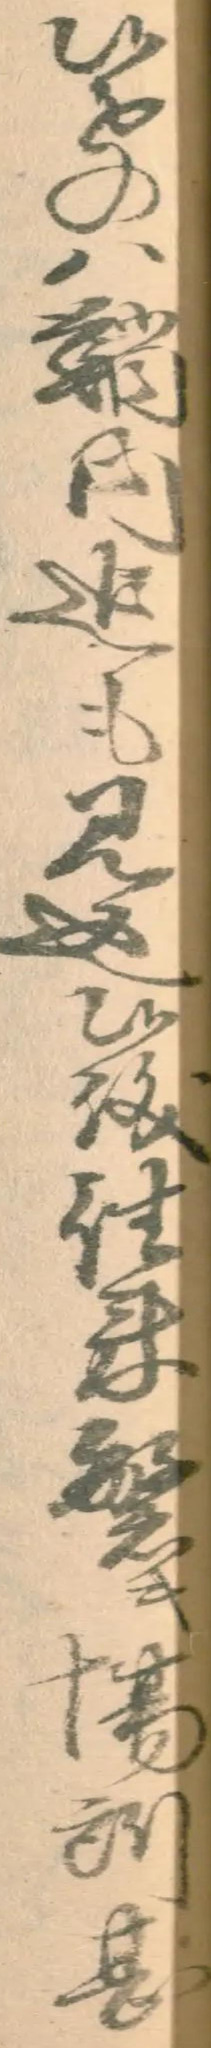候ものハ鞘内迄も見込候儀往来繁キ場所甚
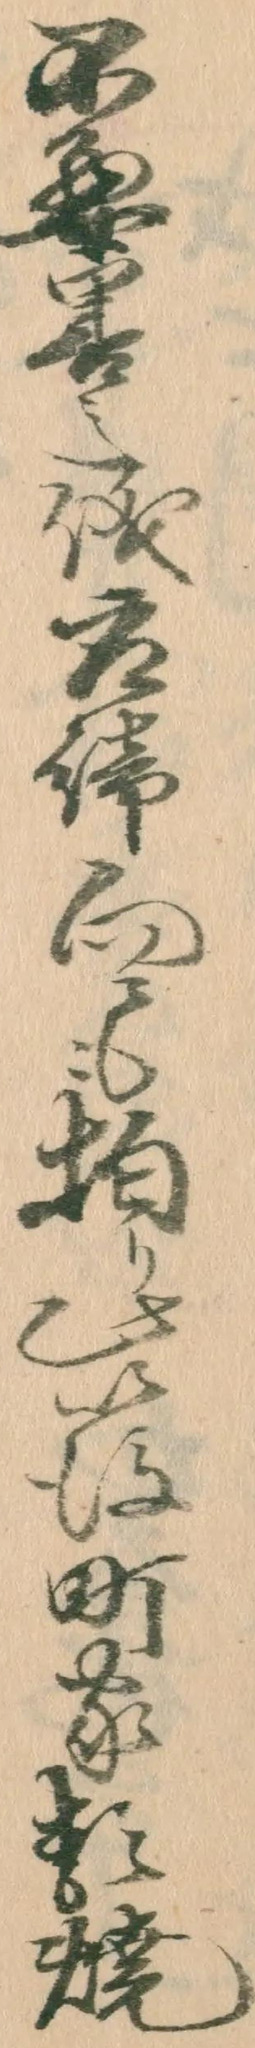不要害之儀取締向ニも拘り此以後町家類焼
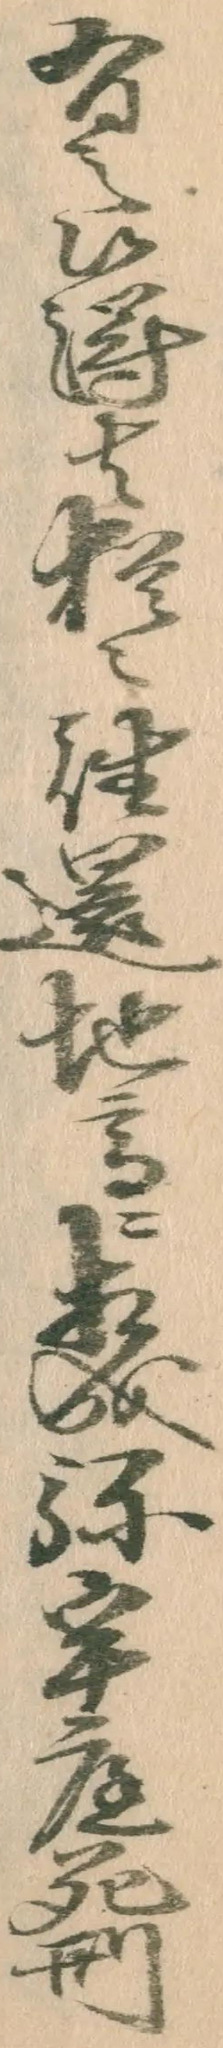有之候得は猶〻往還地高ニ相成弥牢屋死刑
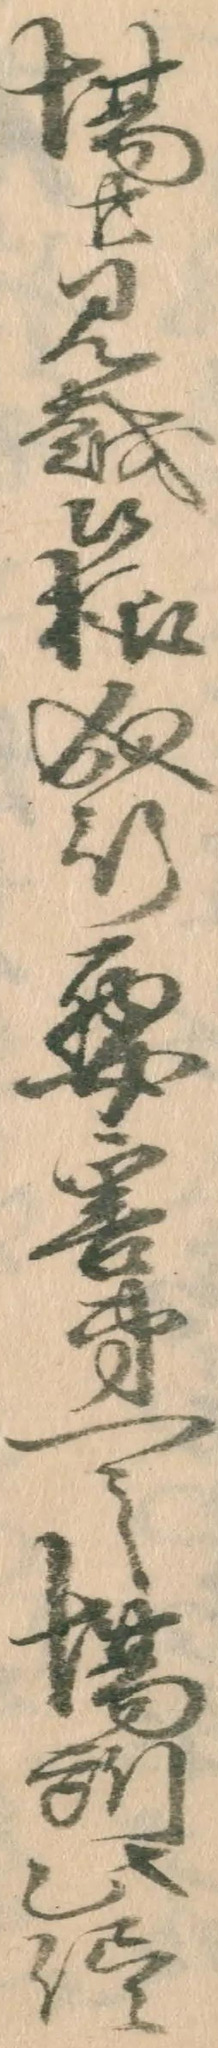場を見越候様成行要害第一之場所此儘
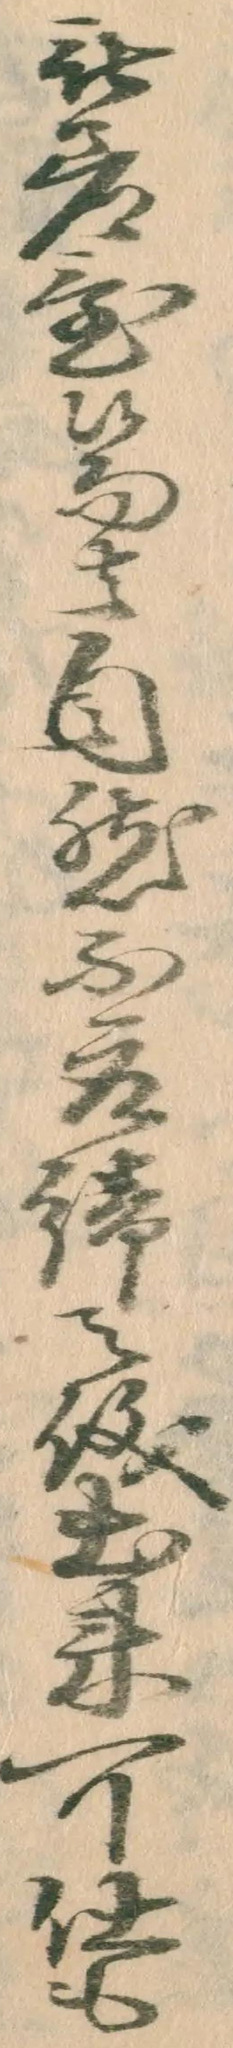被差置候ては自然不取締之儀出来可仕も
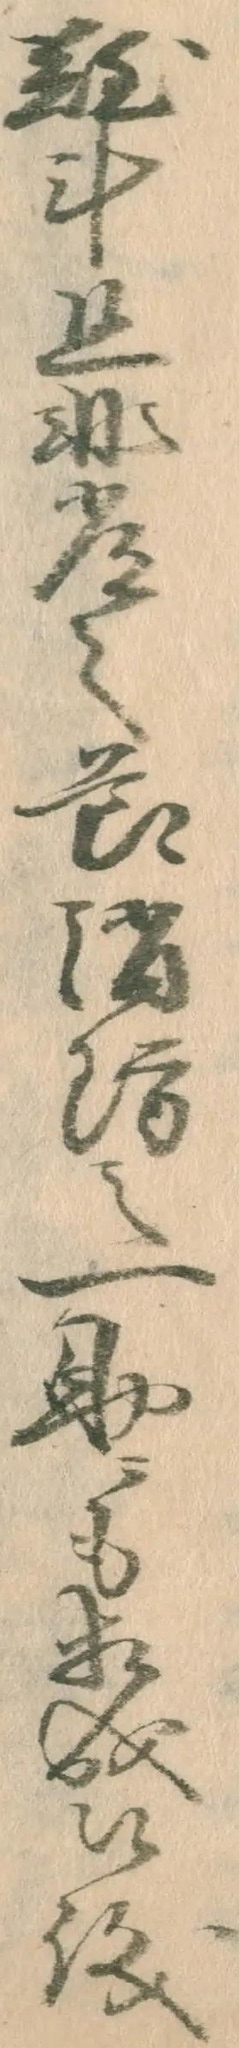難計且非常之節消防之一助ニも相成候儀

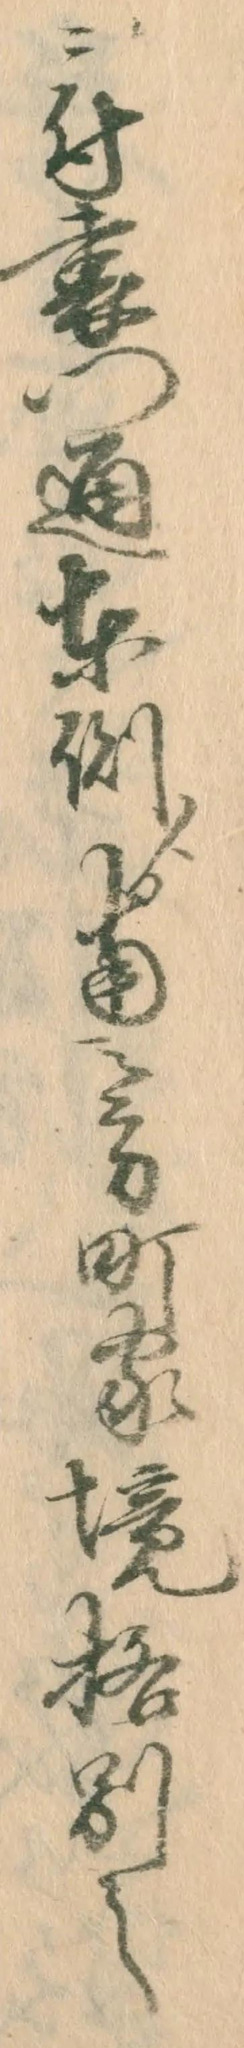ニ付裏門通東側ゟ南之方町家境格別之
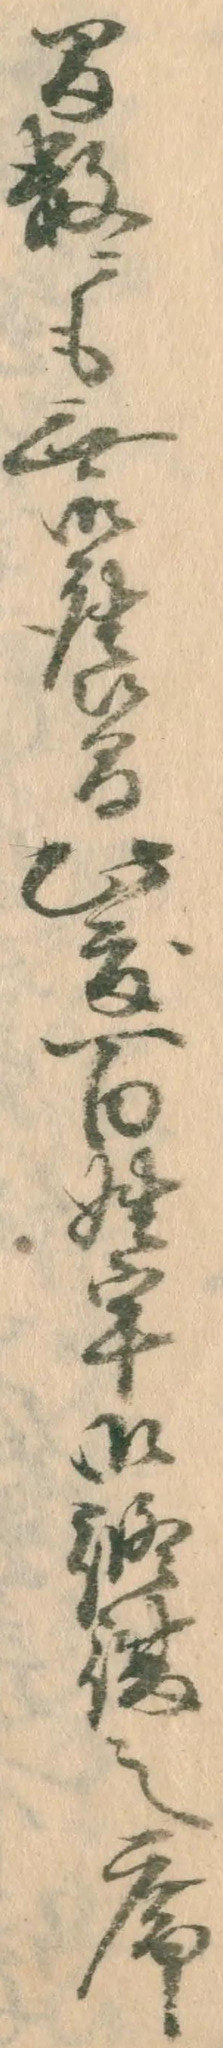間数ニも無御座候間此度百姓牢御修復之序
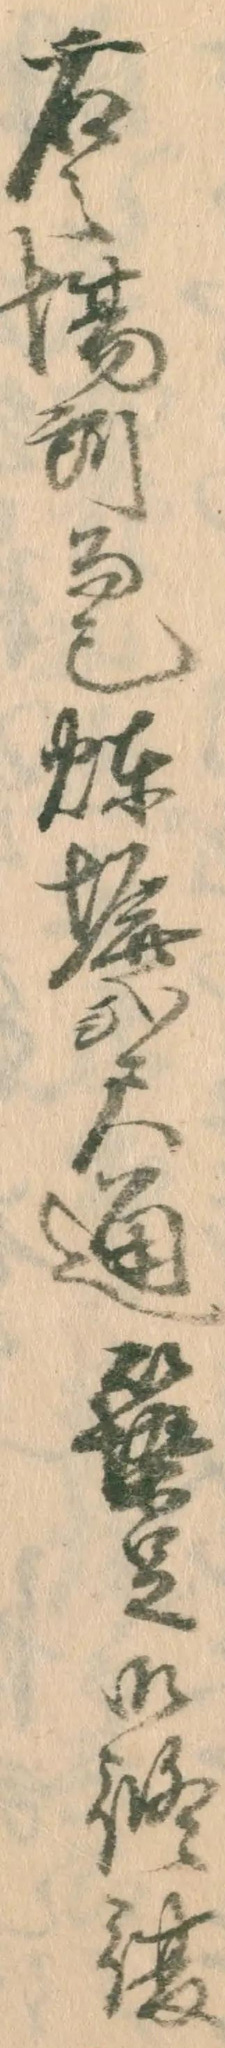右之場所而已煉塀弐尺通築足御修復
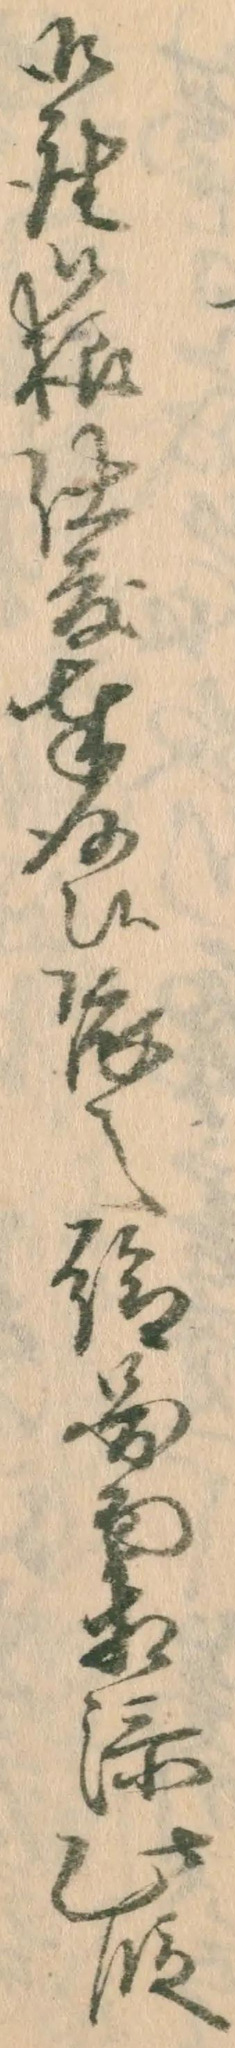御座候様仕度奉存候依之絵図面相添此段
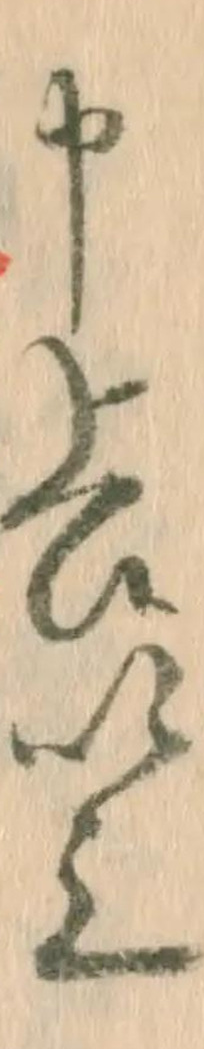申上候以上
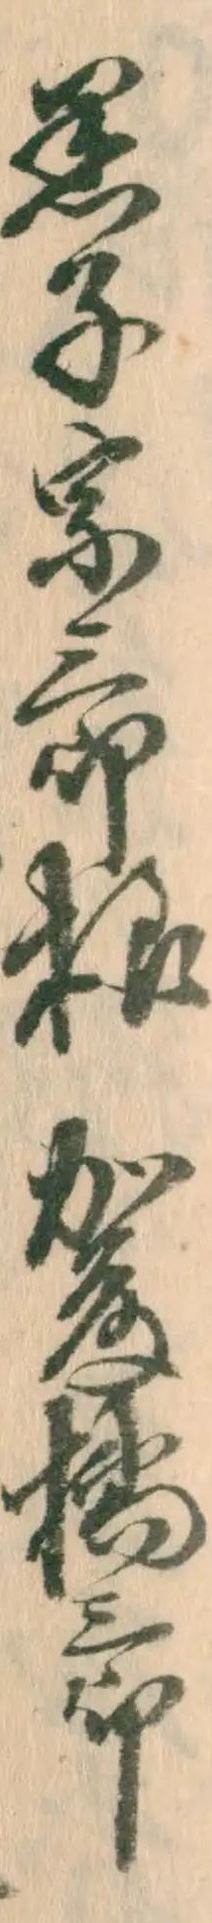│黒子宗三郎様加藤橘三郎
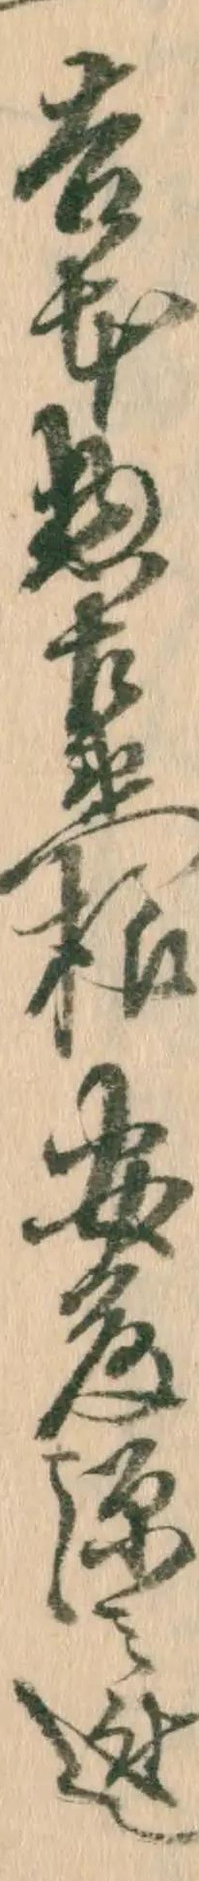│吉本惣左衛門様安藤源之進
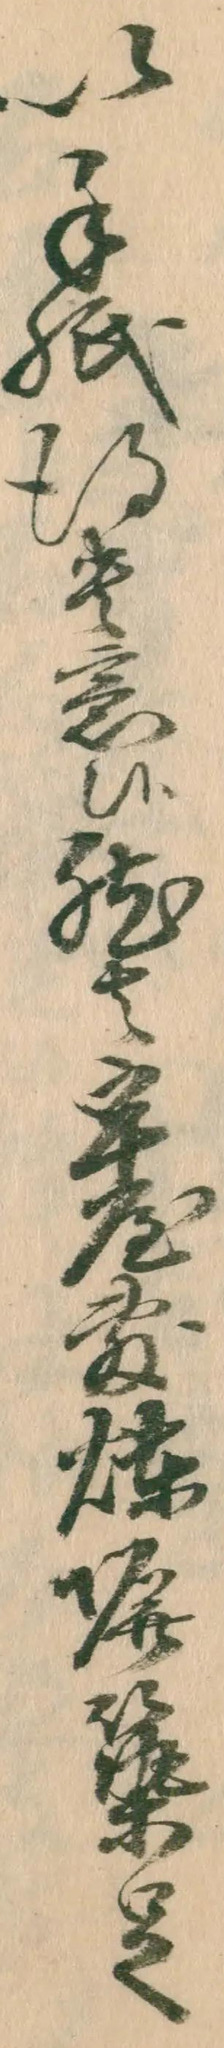以手紙得貴意候然は郎屋敷煉塀築足
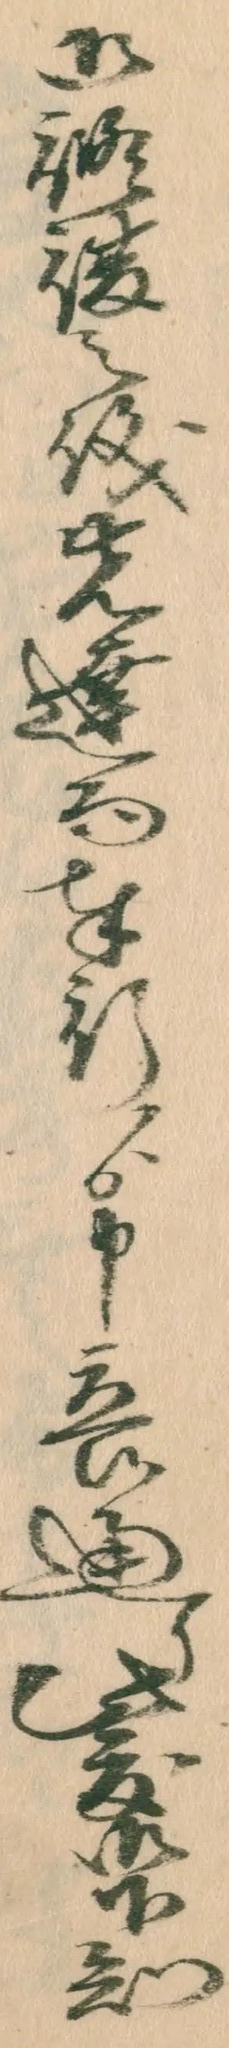御修復之儀先達て奉行ゟ申立候通り此度御下知
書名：七十冊物類集 71巻. [44] 四十三 牢屋敷御普請御修覆地震ニ付骨折候牢屋掛御褒美之部
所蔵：国立国会図書館 National Diet Library, JAPAN
